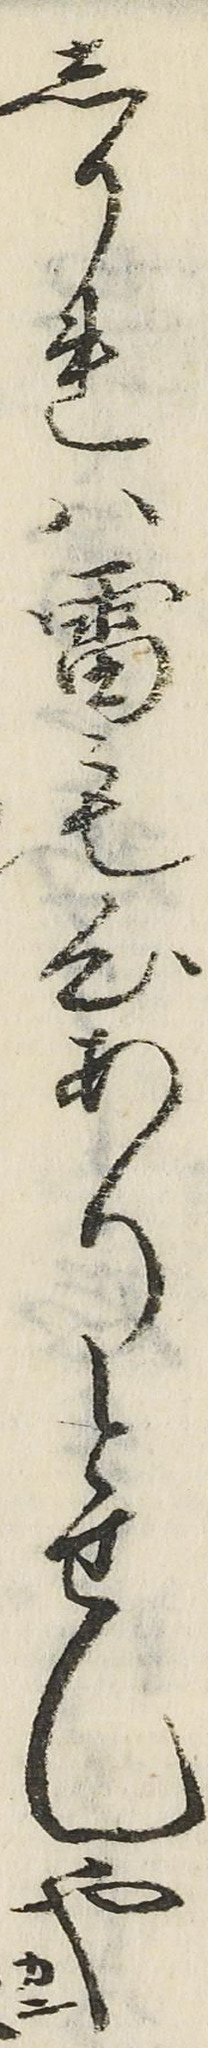しかれは雷も心ありとせんや

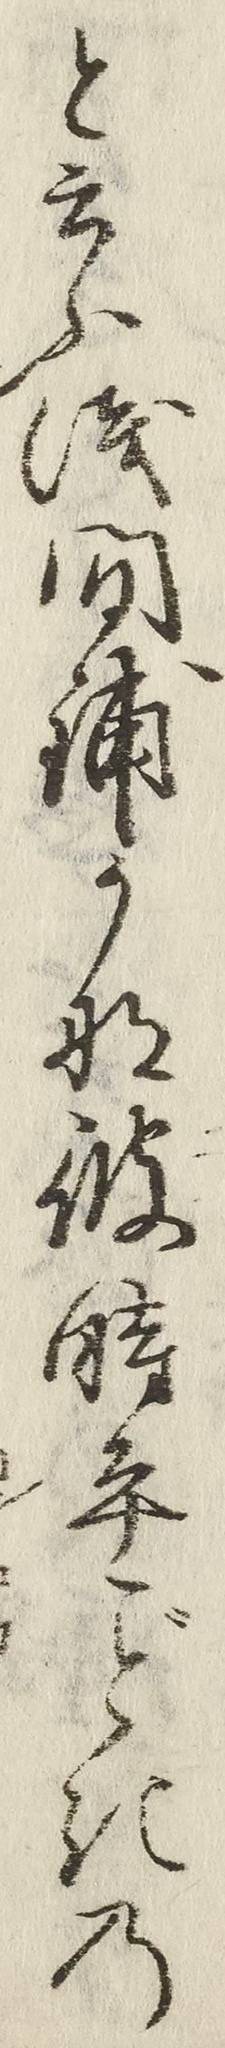と云ふ浅間鋪かな彼時平ごときの
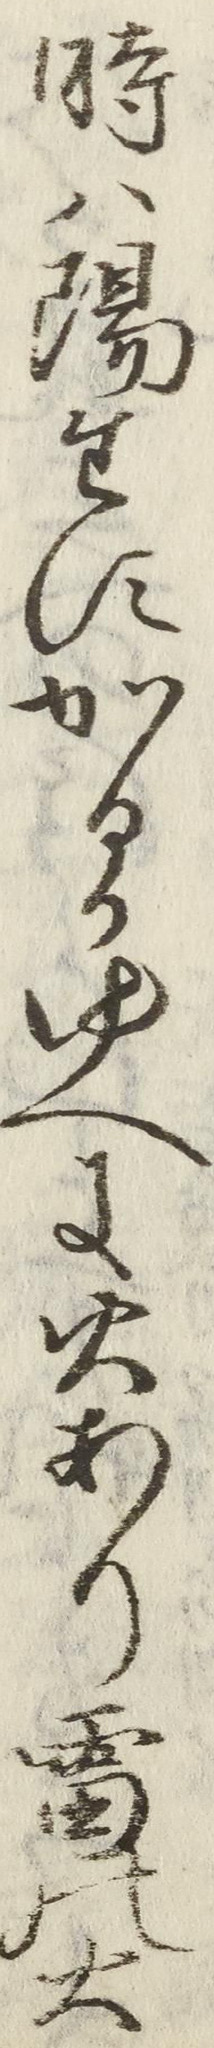時は陽生すかるかゆへに火あり雷の火
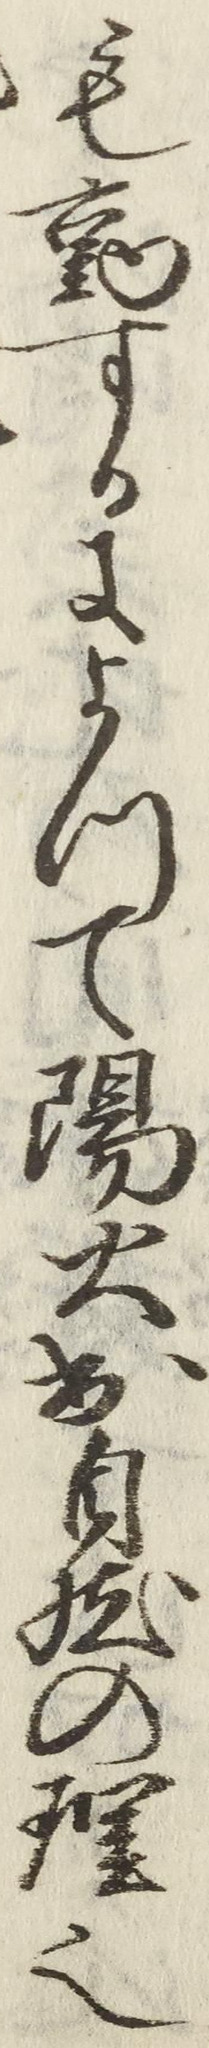も動するによつて陽火出自然の理也
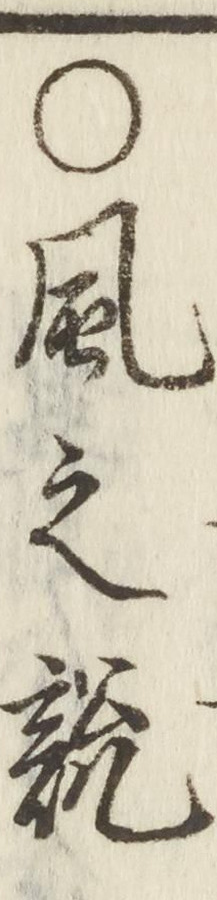○風之説
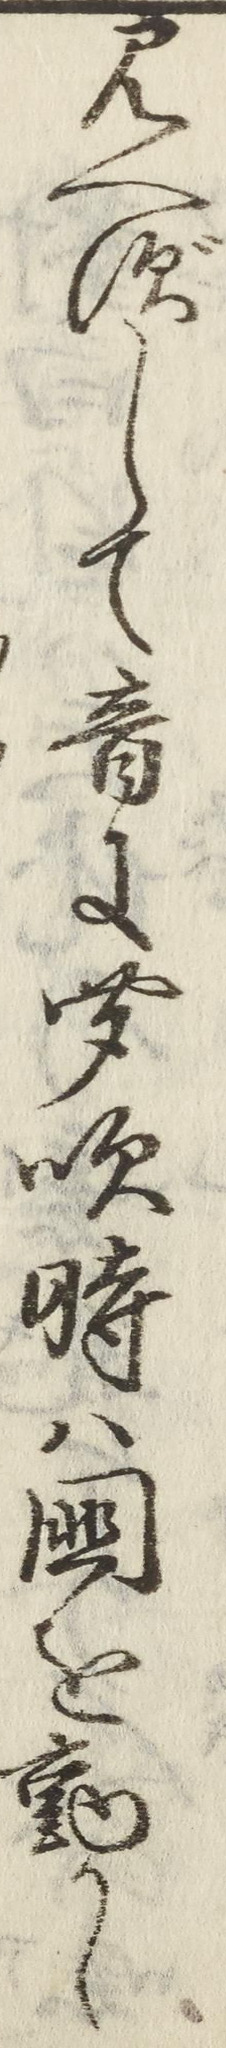見へずして音に聞吹時は国を動かし
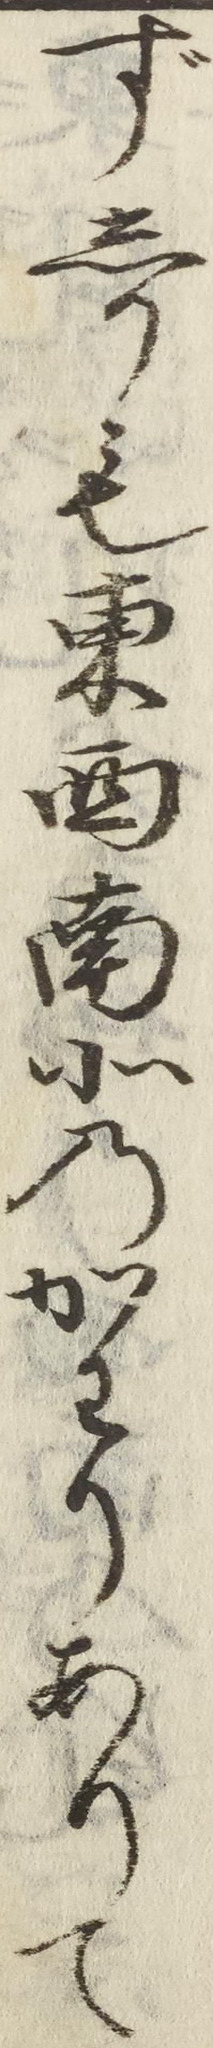ずしかも東西南北のかわりありて

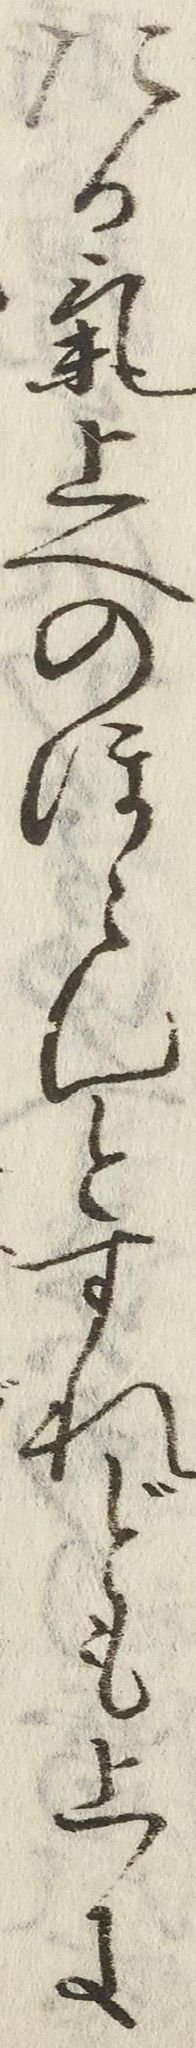たる気上へのほらんとすれども上に

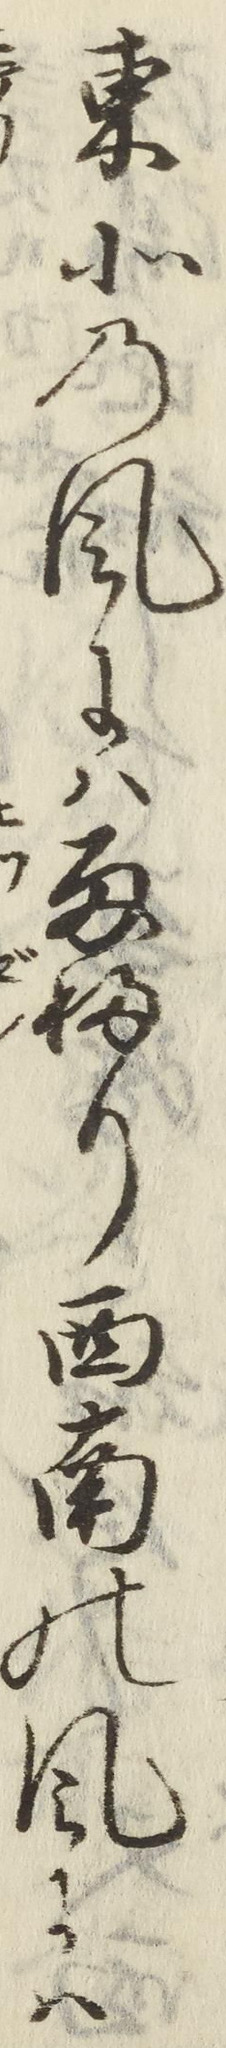東北の風には雨ふり西南の風には

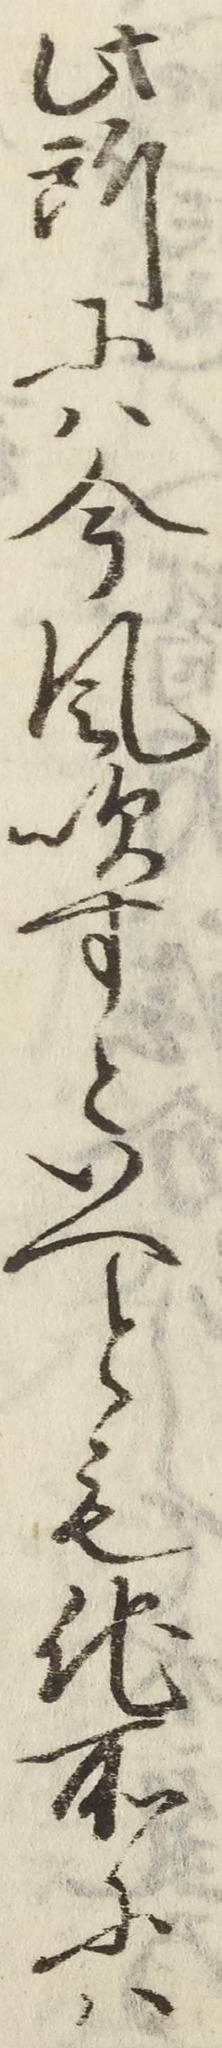此所には今風吹すといへとも他所には
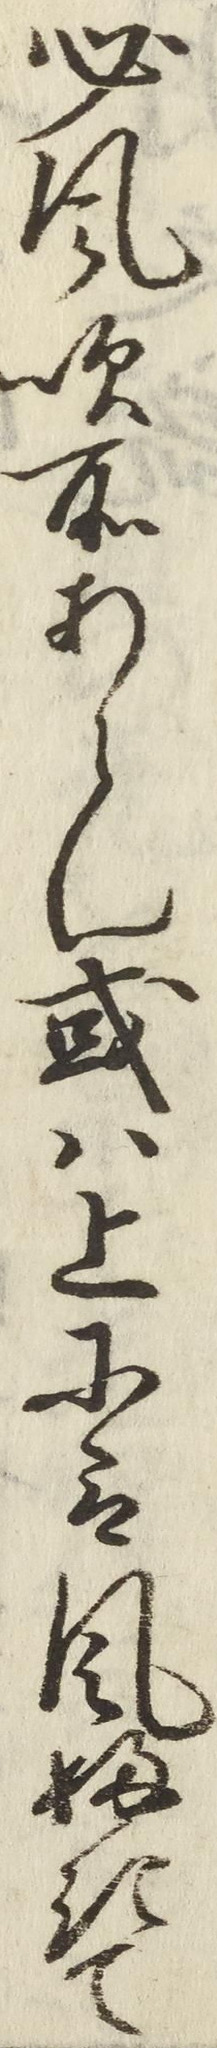必風吹所あらん或は上には風ふきて
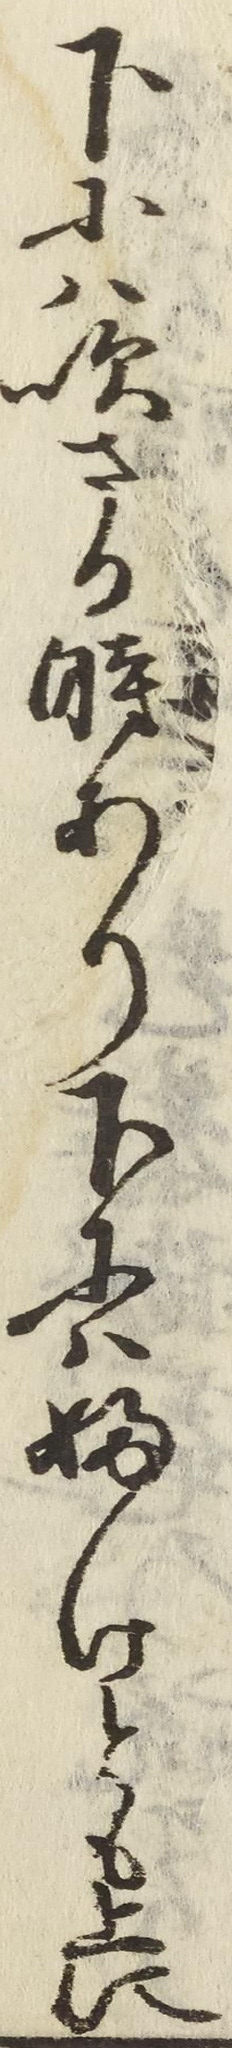下には吹さる時あり下にはふけとも上に

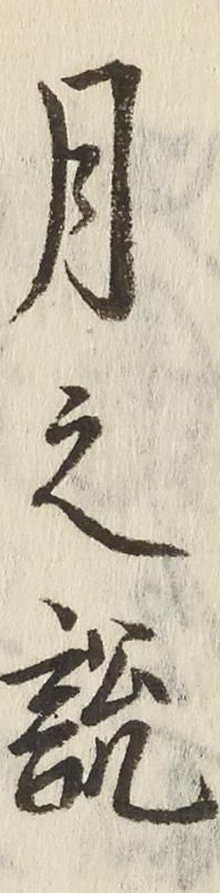月之説
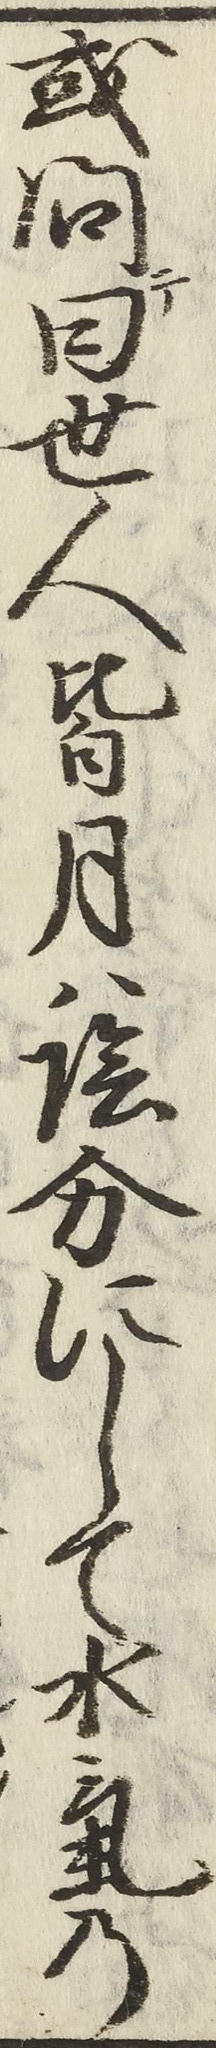或問曰世人皆月は陰分にして水気の
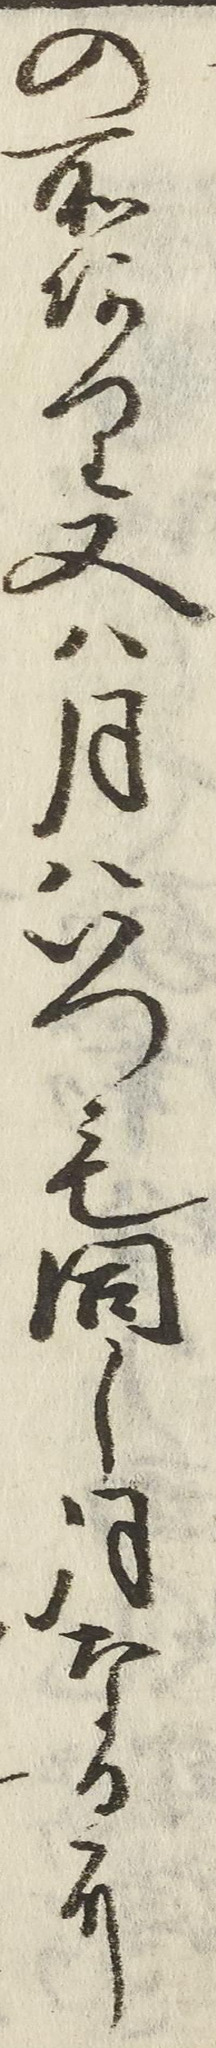の所あり又は月はいつも同し月なるに
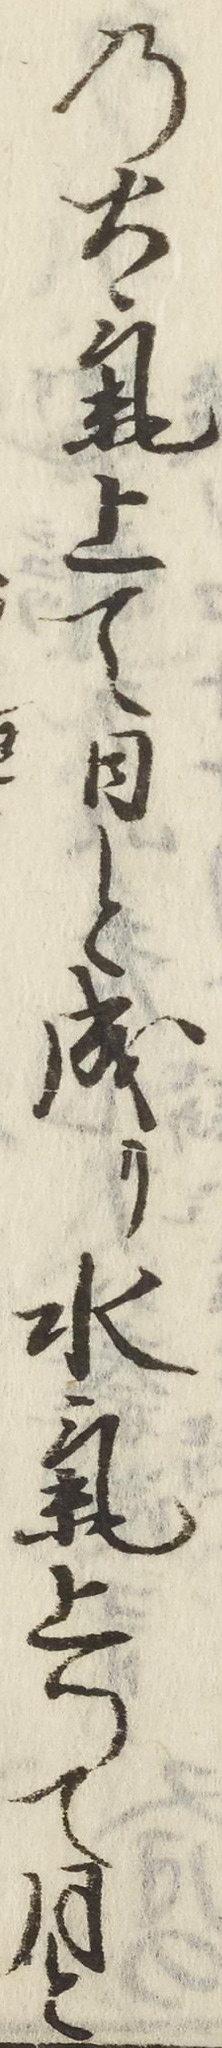の火気上て日と成り水気上つて月と
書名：天地或問珍　天
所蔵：東京大学地震研究所図書室 Earthquake Research Institute Library, The University of Tokyo, JAPAN
